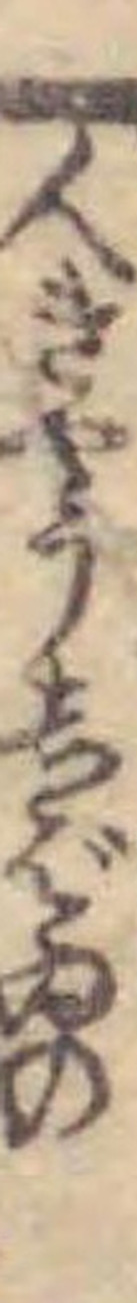人きやうしばゐの
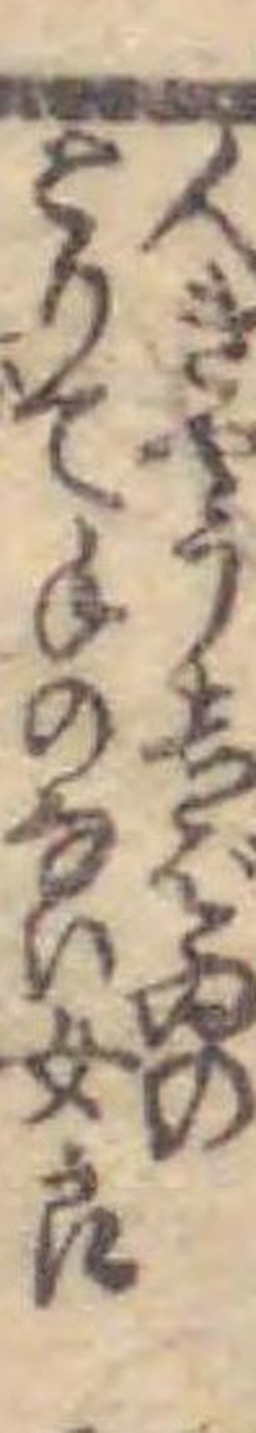とりて手のない女郎
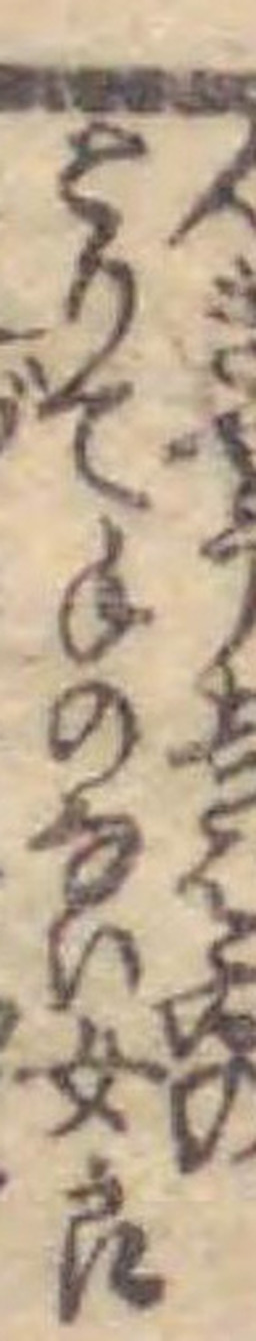とりて手のない女郎
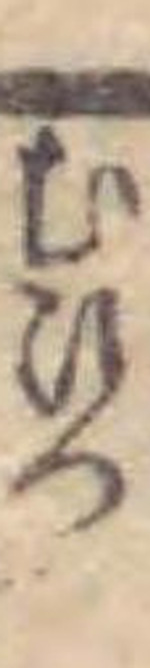むひつ
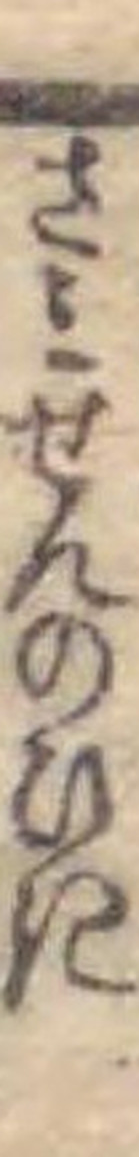さみせんのひき
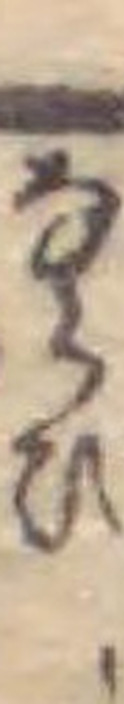ならひ
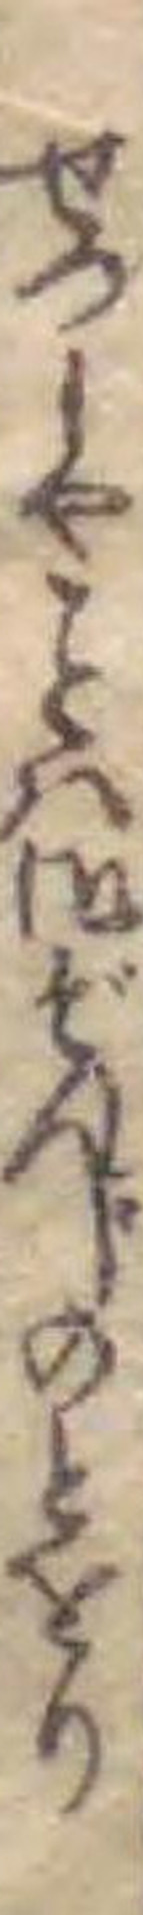せつしやことは御ぞんじのとをり
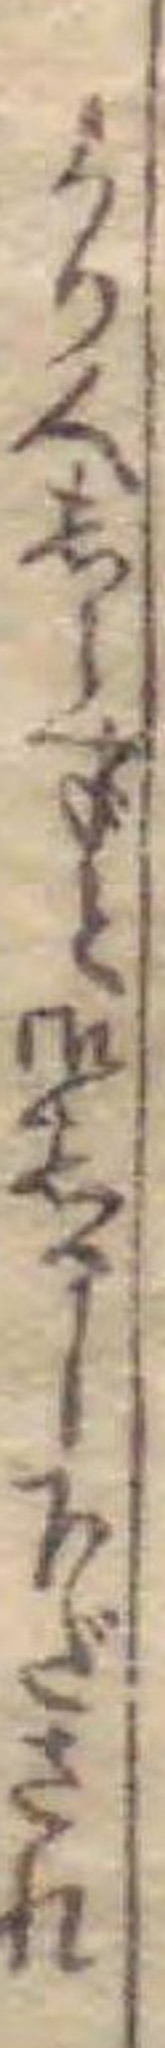かり人しらずと御しるし下だされ
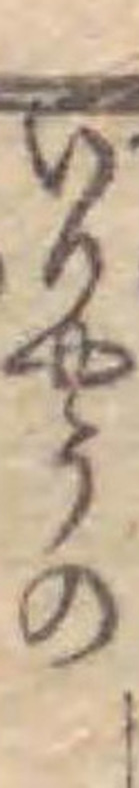いりやうの
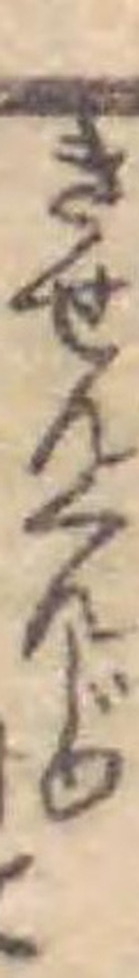きせんくんじゆ
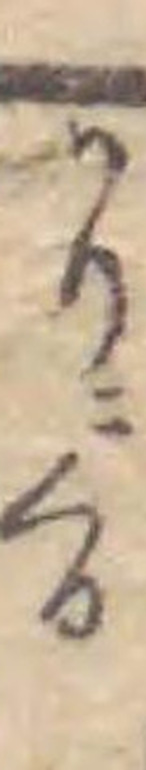かりにくる
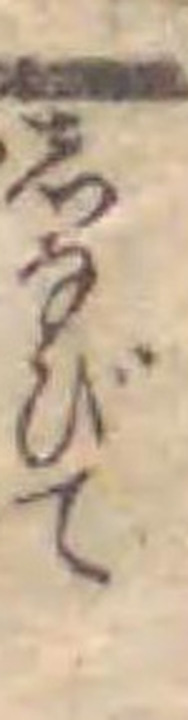しなびて
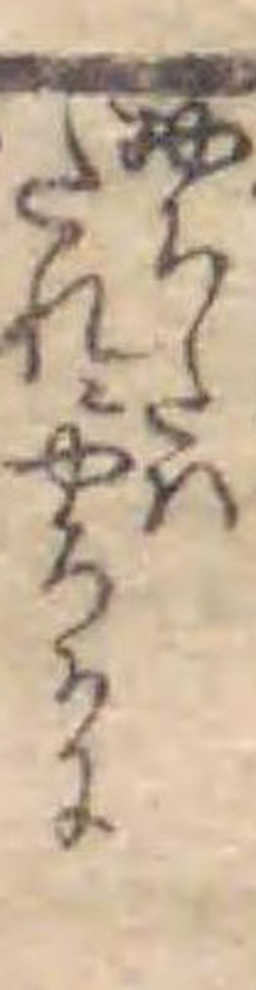たれにやろうかに
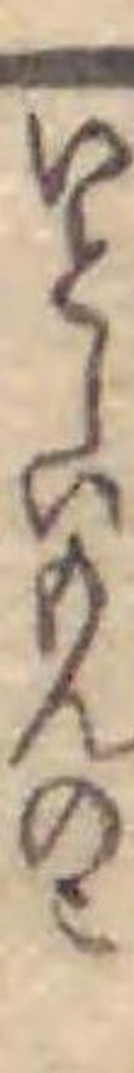いとしいもんのこ
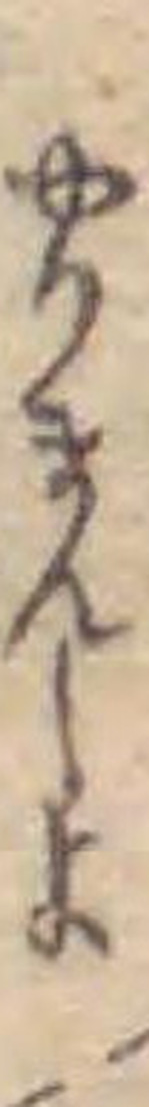やりまんしよ
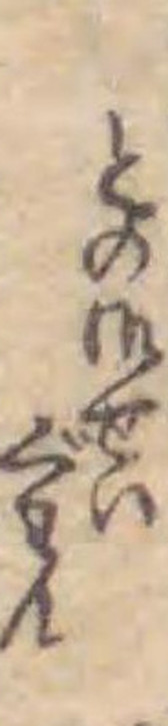との御せい
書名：大悲の千六本 : 1巻
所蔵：国立国会図書館 National Diet Library, JAPAN
